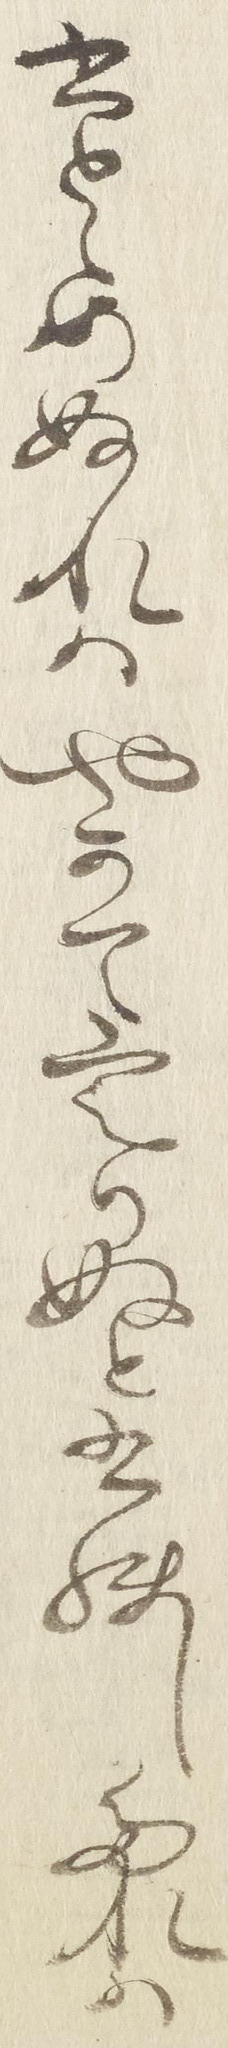書とめぬれはやかて定りぬと書残したれは
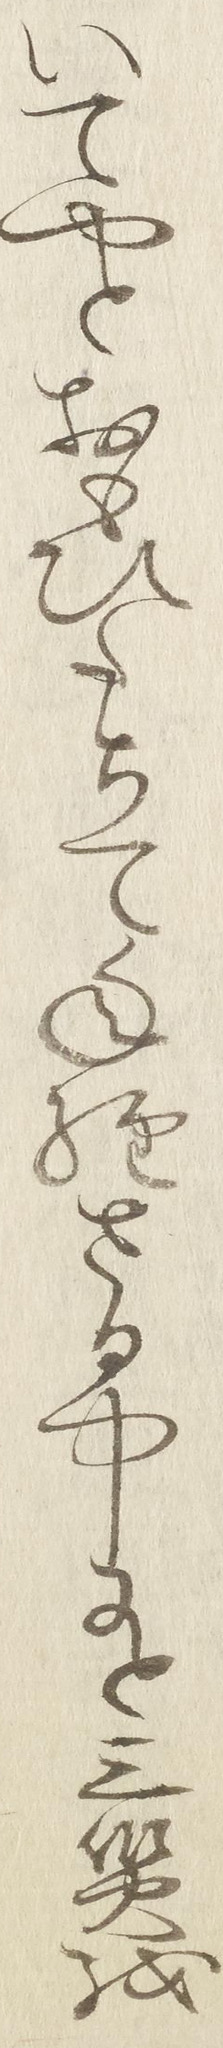いてやとおもひたちて年経さる中にと三災を
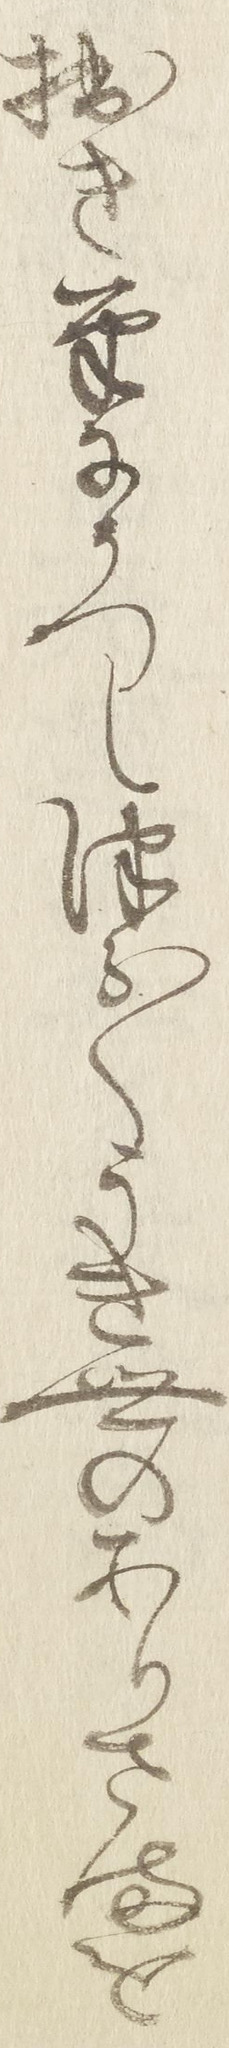拙き筆にうつしつら〳〵うき世のありさまを
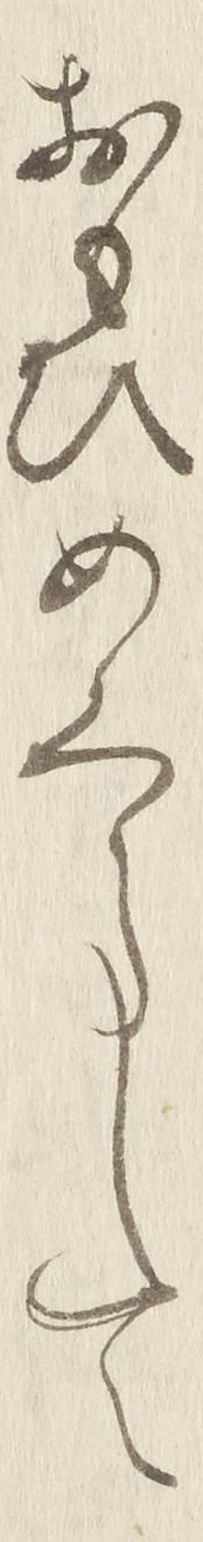おもひめくらして
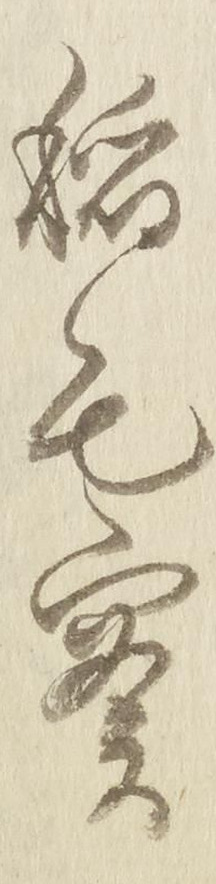稲毛実
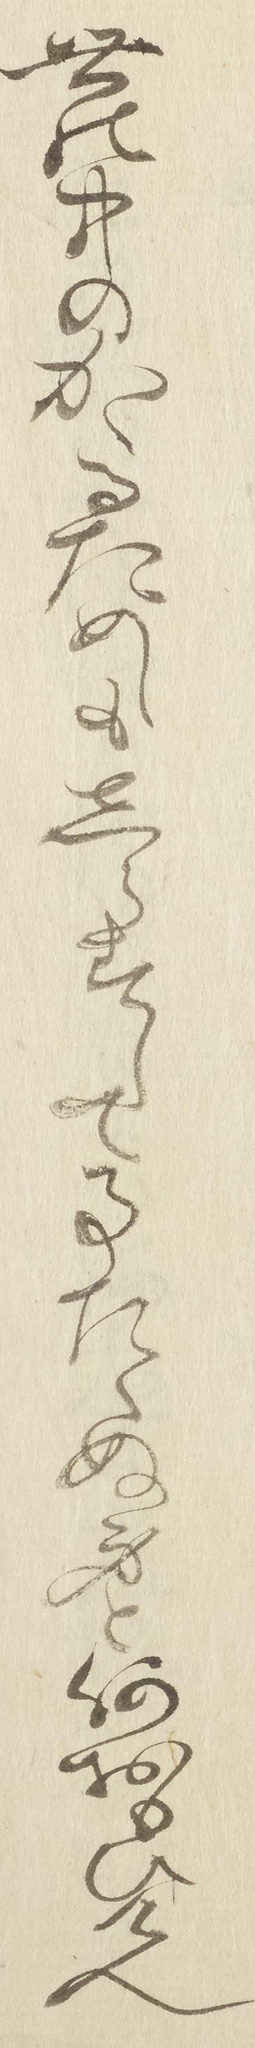世の中のかゝるためしもしらすして事たゝぬ身と何おもひけん

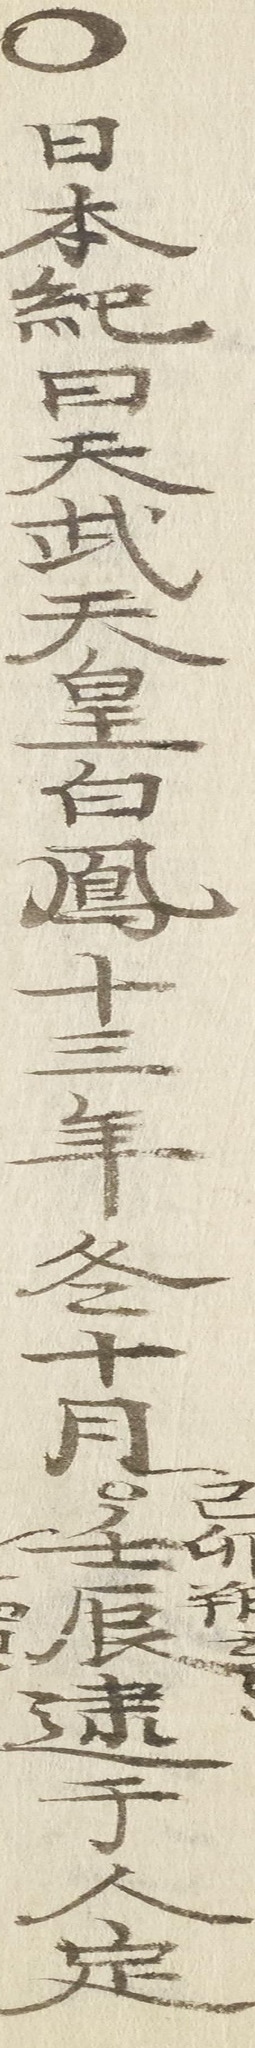◯日本紀曰天武天皇白鳳十三年冬十月〇壬辰逮干人定
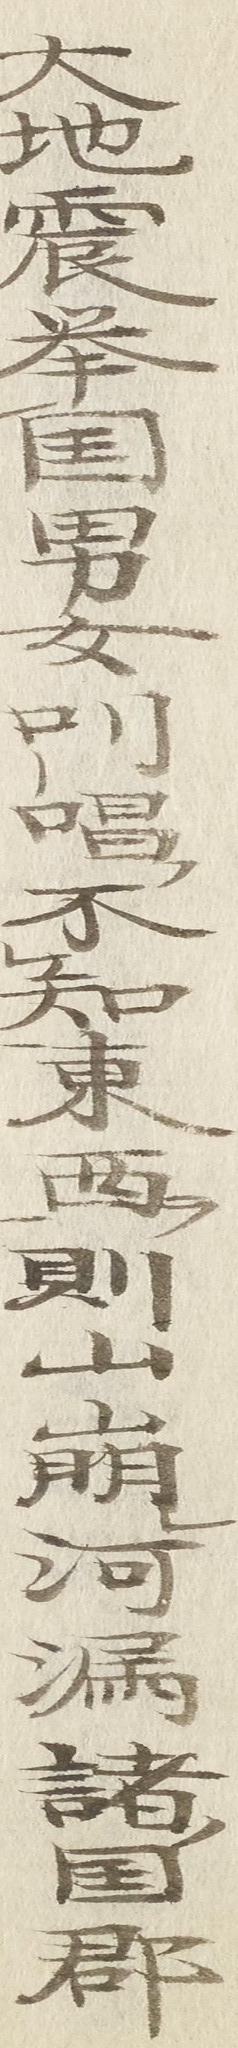大地震挙国男女別唱ノ不知東西則山崩ㇾ川漏諸ノ国郡
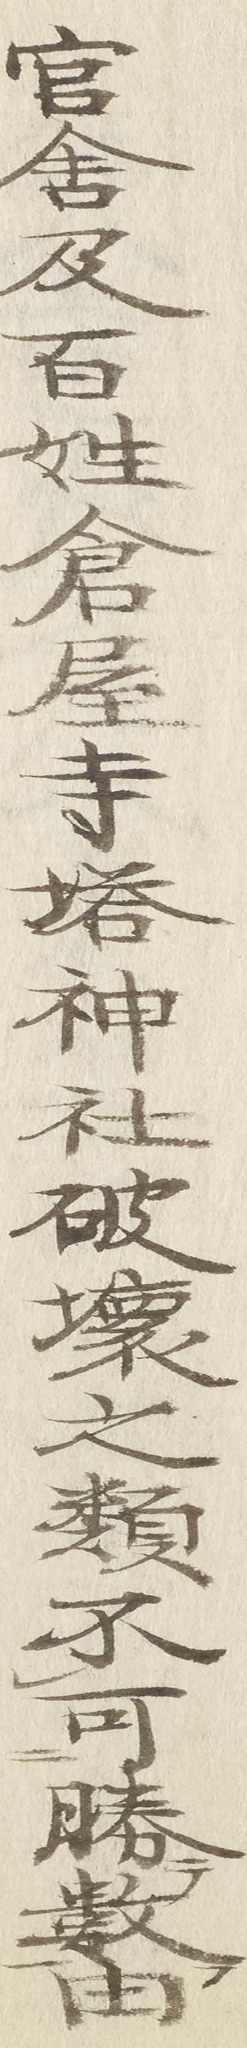官舎及百姓倉屋寺塔神社破壊之類不可勝テ数フ由
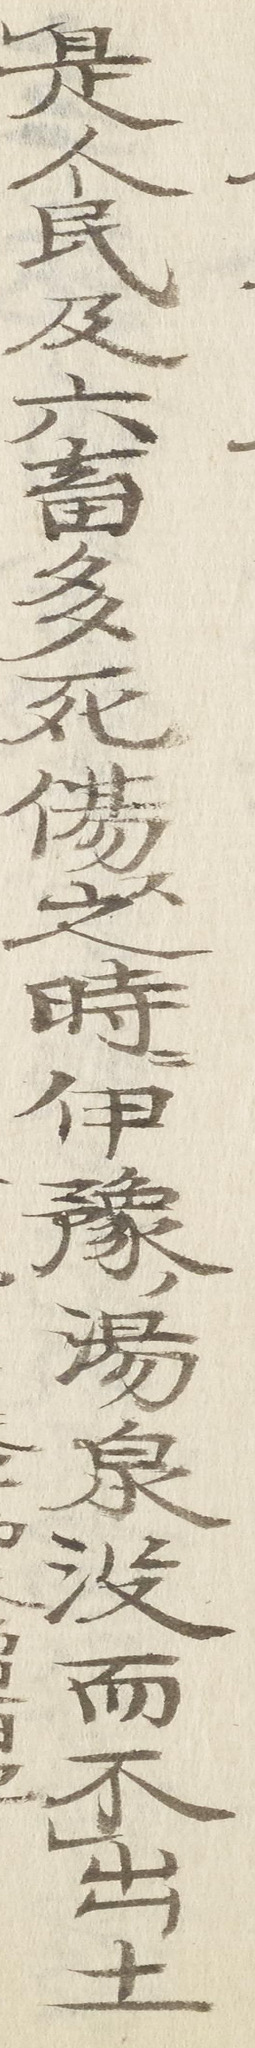是人民及六畜多死傷ス之時二伊豫ノ湯泉没而不出土
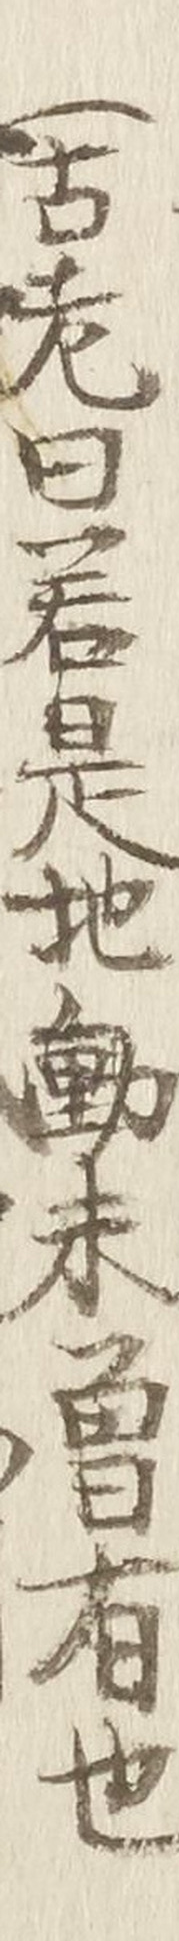（古老曰若是地動未曾有也
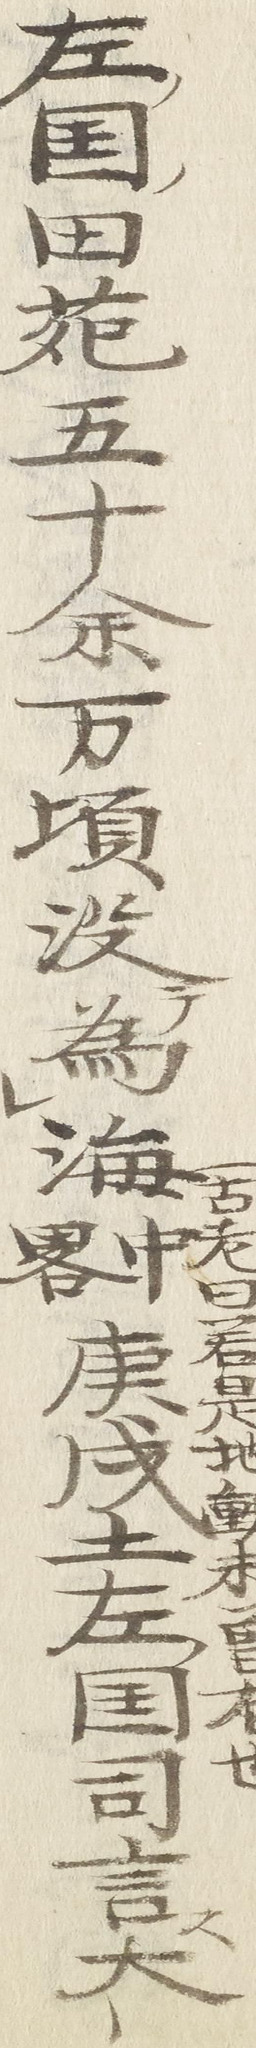左国田苑五十余万頃没テ為海中略庚戌土左国司言ス大
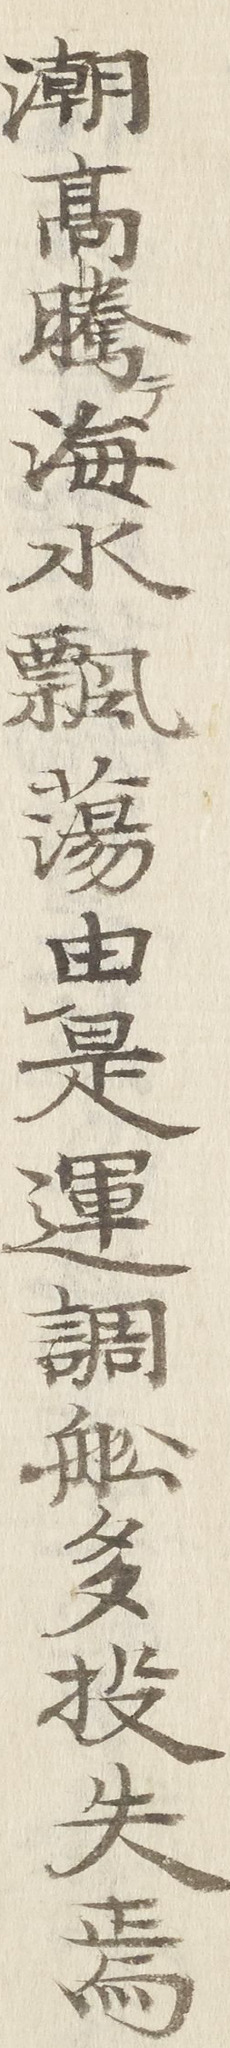潮高騰テ海水飄蕩由是運調船多投失焉
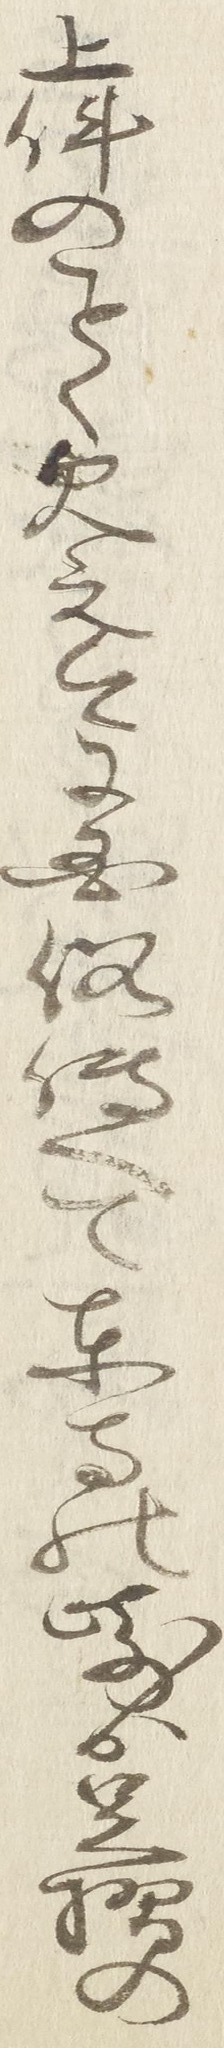上件のことく見え今に国役伝へて東寺の崎ゟ足摺の
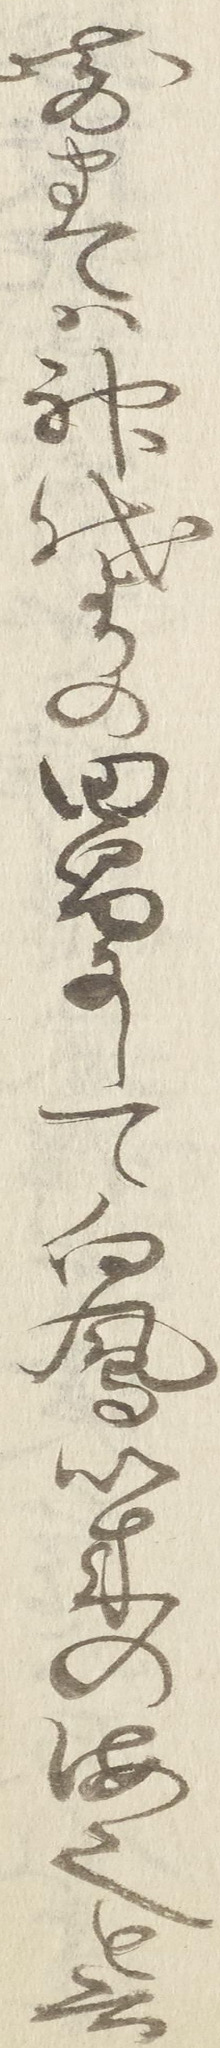崎まては神代よりの田畠にて白鳳以来の海也と云
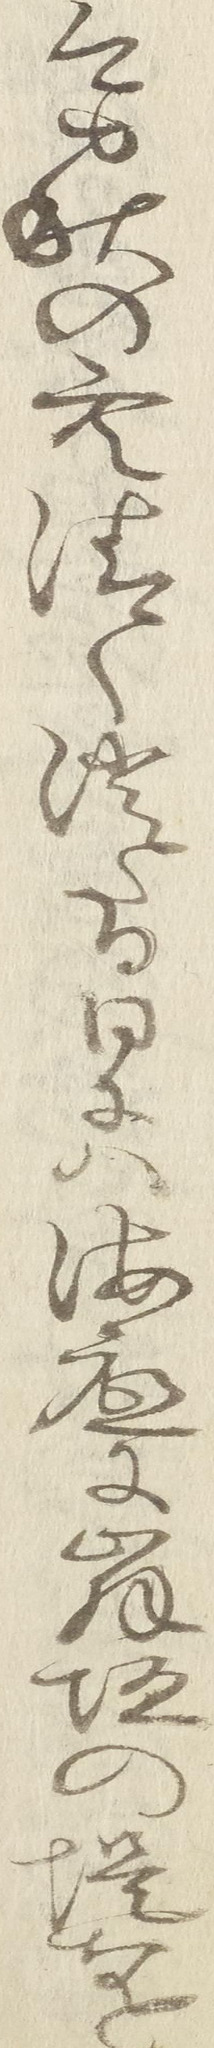今も秋の空清く澄たる日には海底に岸垣の堤なと
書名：地震記　下
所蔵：東京大学地震研究所図書室 Earthquake Research Institute Library, The University of Tokyo, JAPAN
